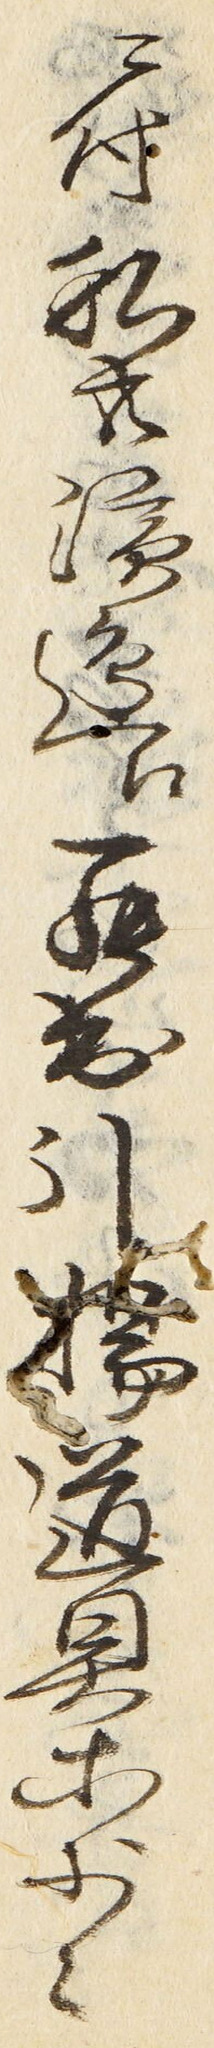ニ付私共浜辺江罷出引揚道具等少々
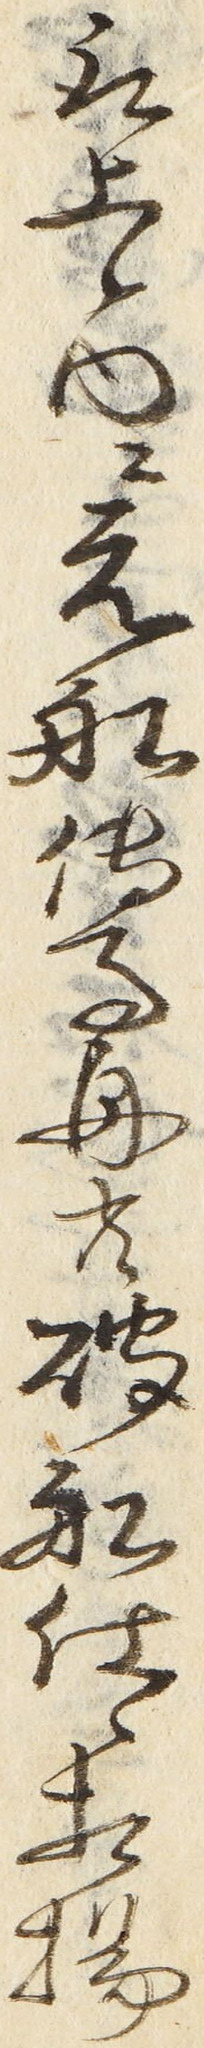取上候内ニ元船伝馬舟共破船仕候相揚
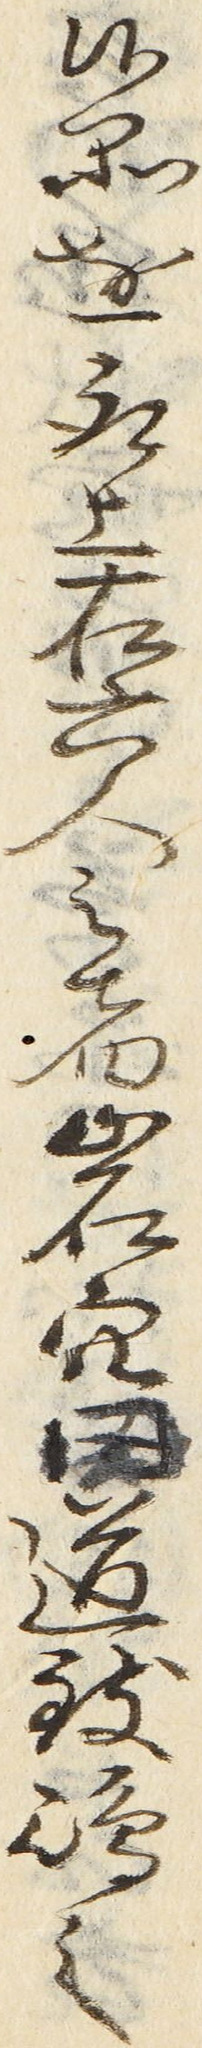候品を取上右六人之者岩穴同道致嶋之
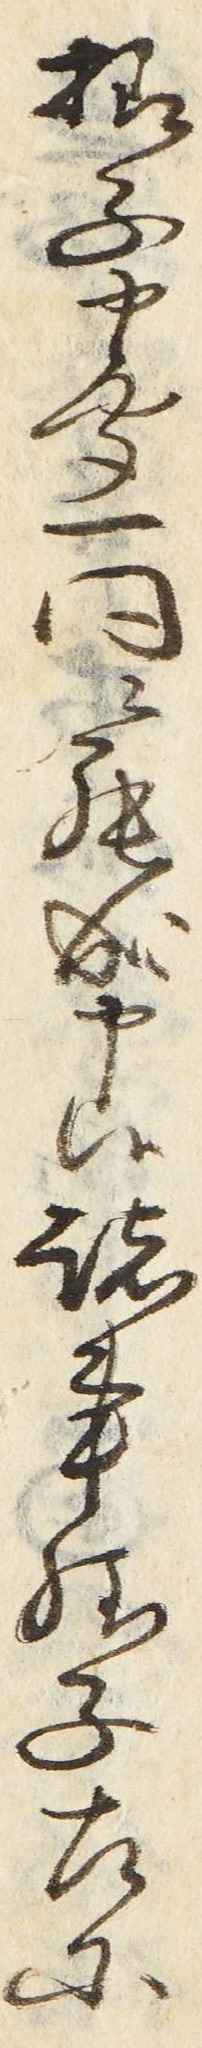様子申聞一同ニ罷成申候諸事様子左に
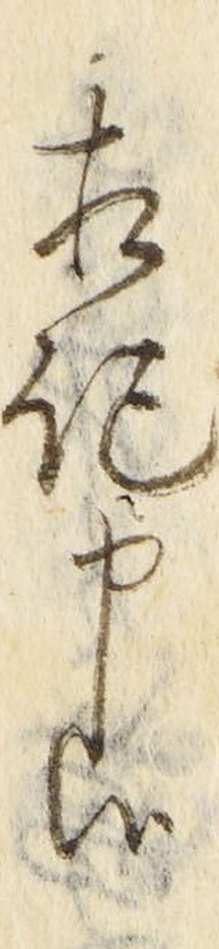相記申候
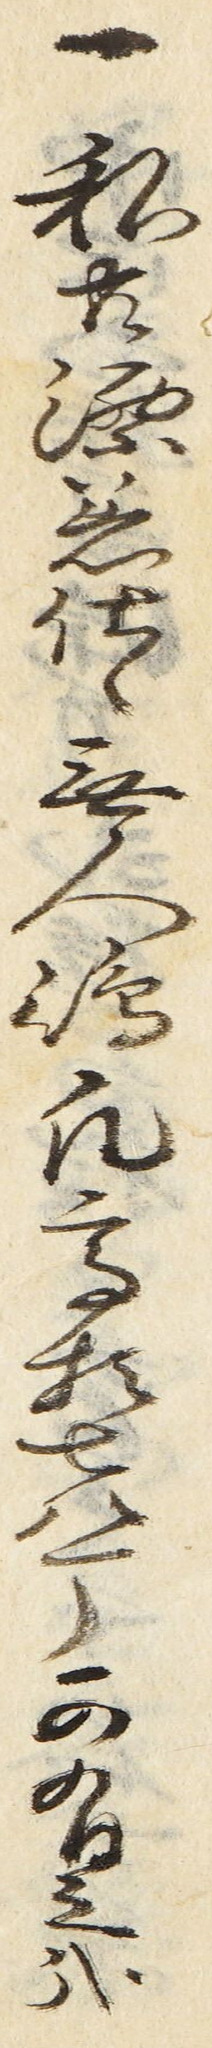一私共漂着仕候無人嶋凡高拾七八丁可有之哉
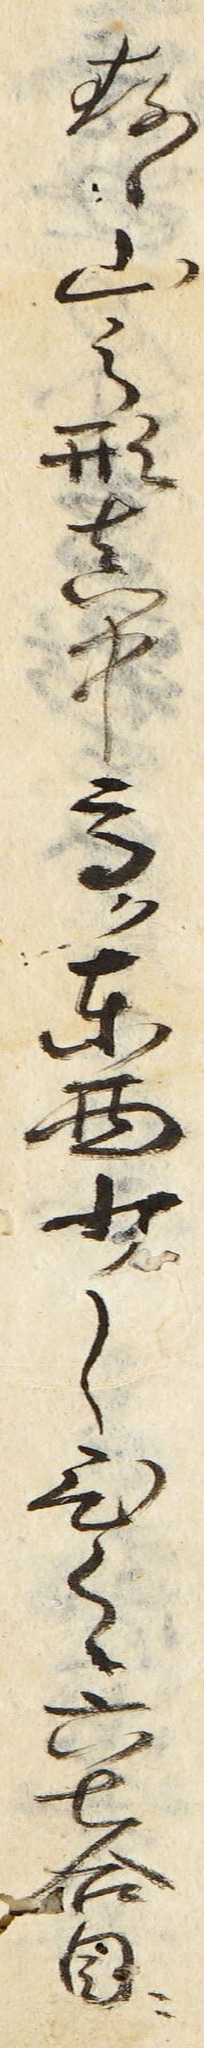存候山之形真中高ク東西少しひくゝ六七合目ニ
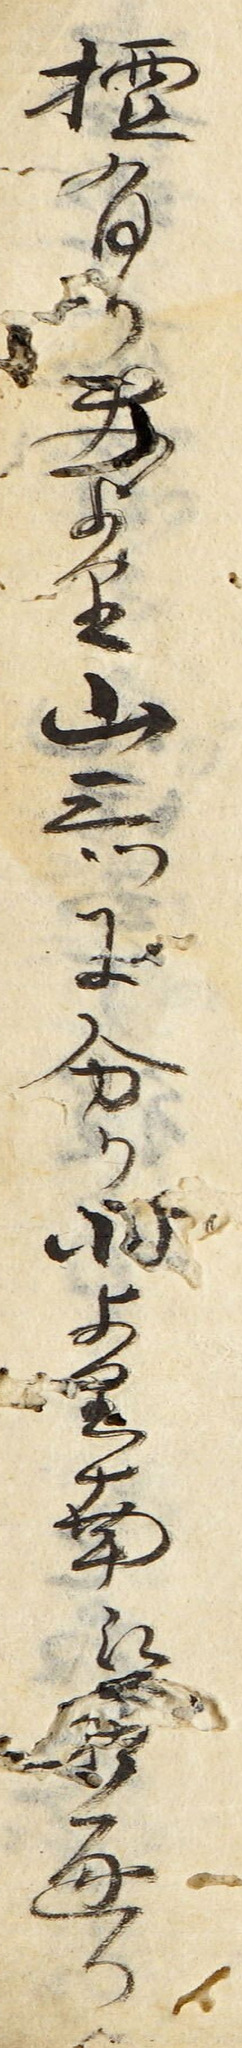壇有りより山三ツに分り此より南江通り

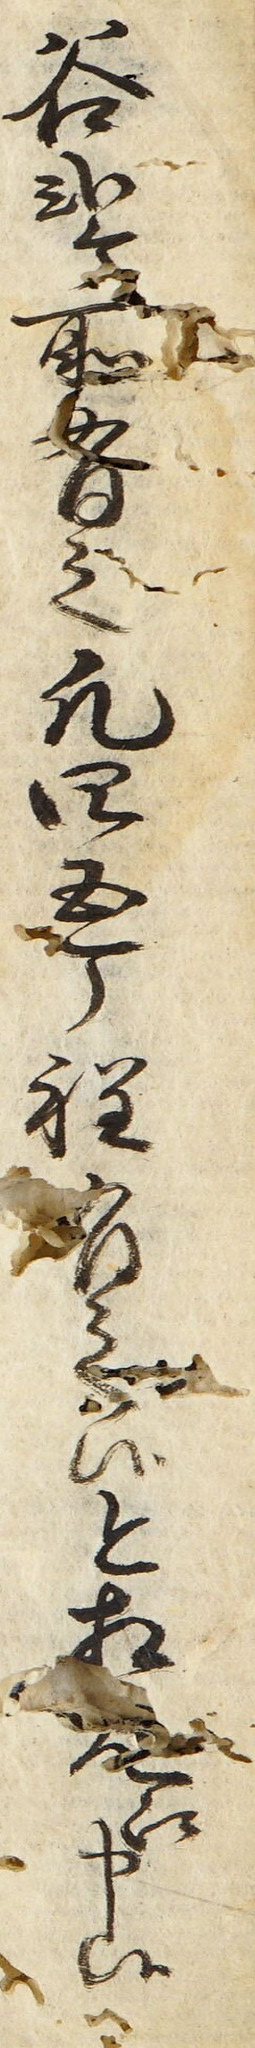谷弐ケ所有之凡四五丁程有之候と相見江申候
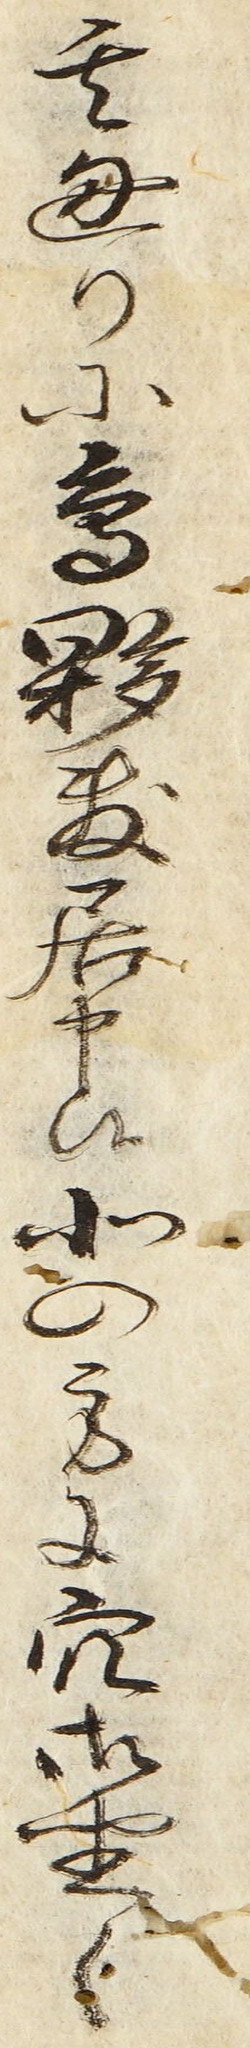其辺りに鳥夥敷居申候北の方に穴御座候
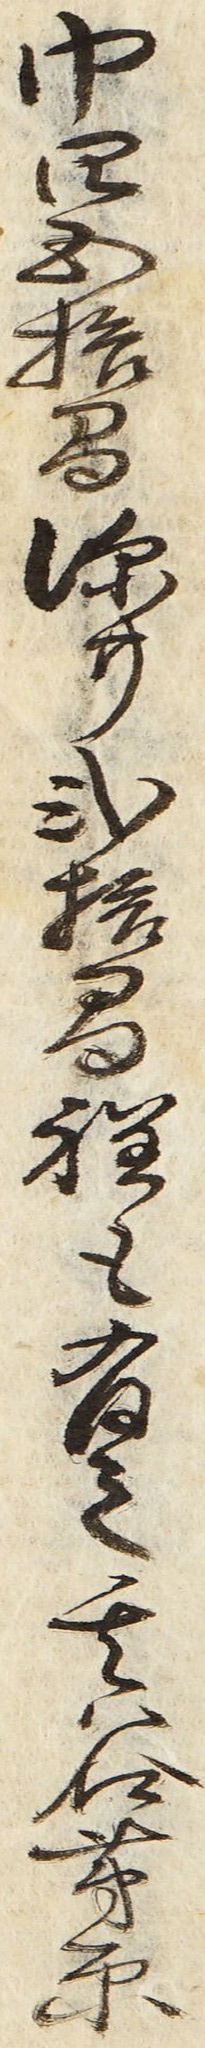巾四五拾間深サ弐拾間程も有之其谷茅原
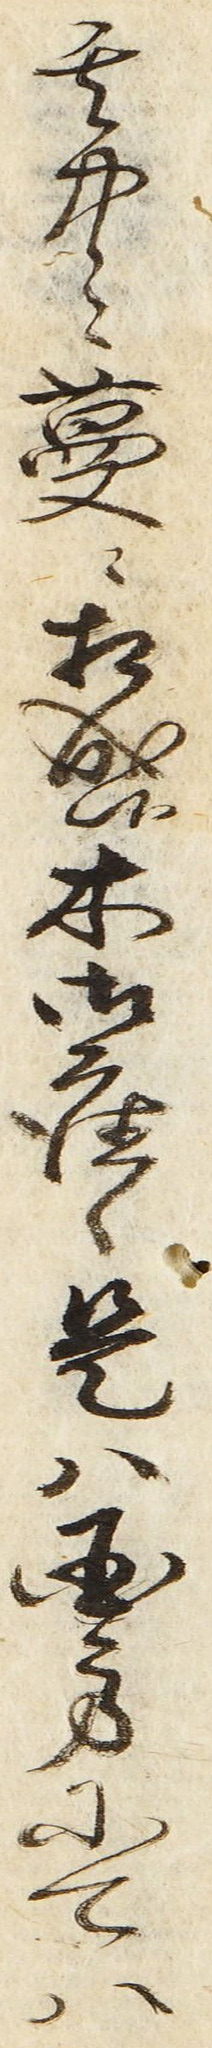其中ニ蔓ニ相成候木御座候是ハ国方にてハ
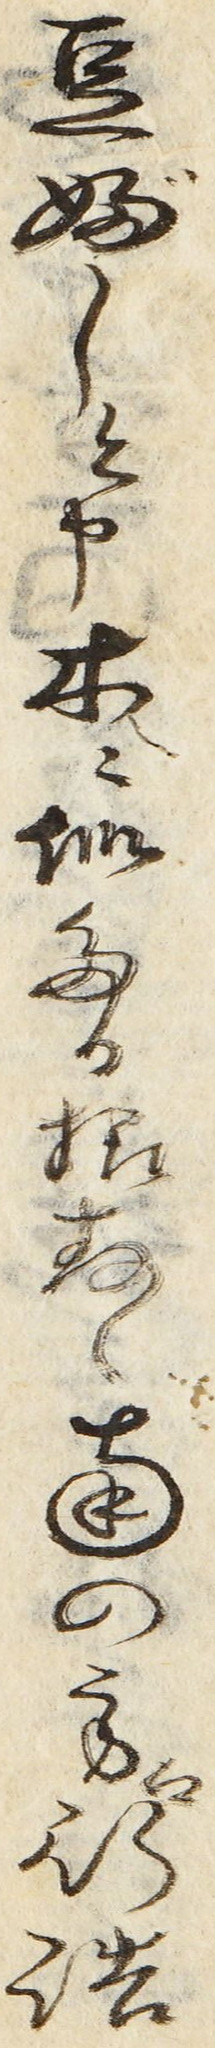豆ぶしと申木ニ似たる様存候南の方江行詰
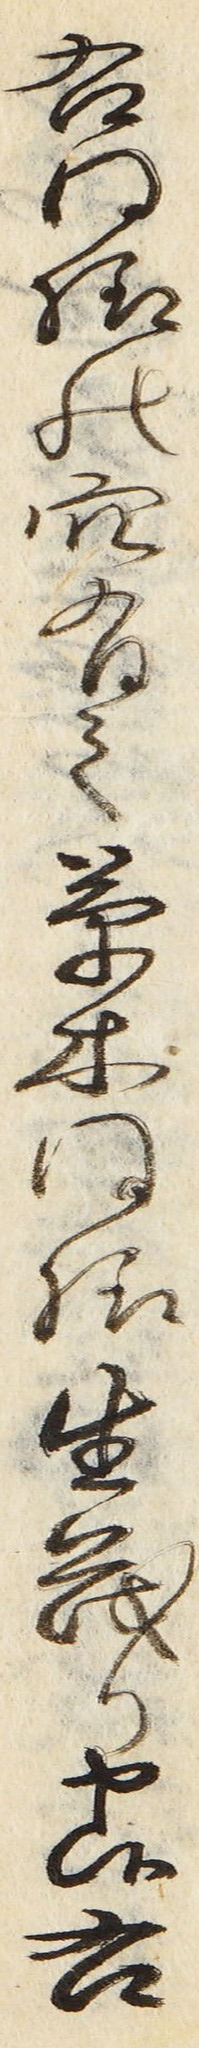右同様の穴有之草木同様生茂り申候右
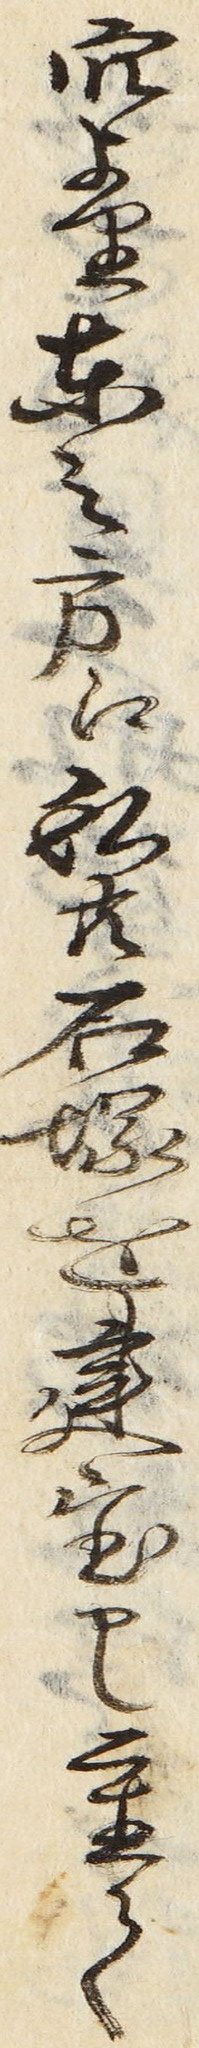穴より東之方江私共石塚を建置申候重て
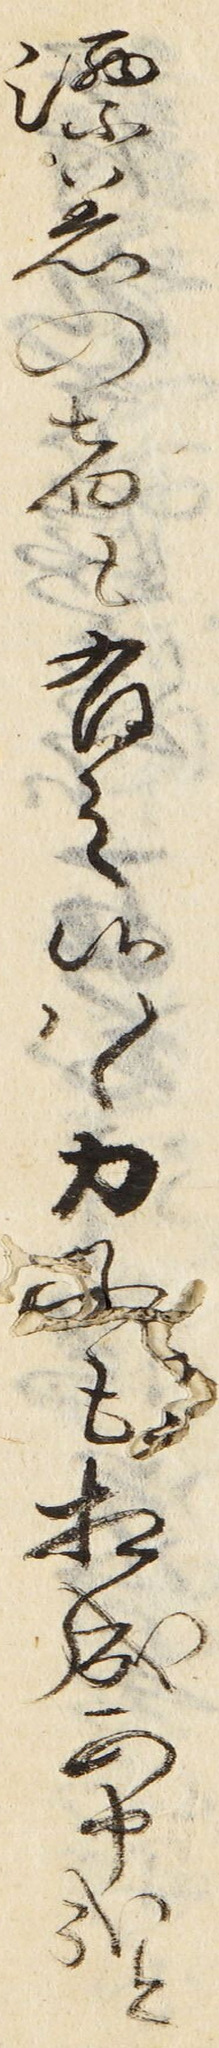漂着の者も有之候ハヽ力にも相成可申哉と
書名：漂流一件上書
